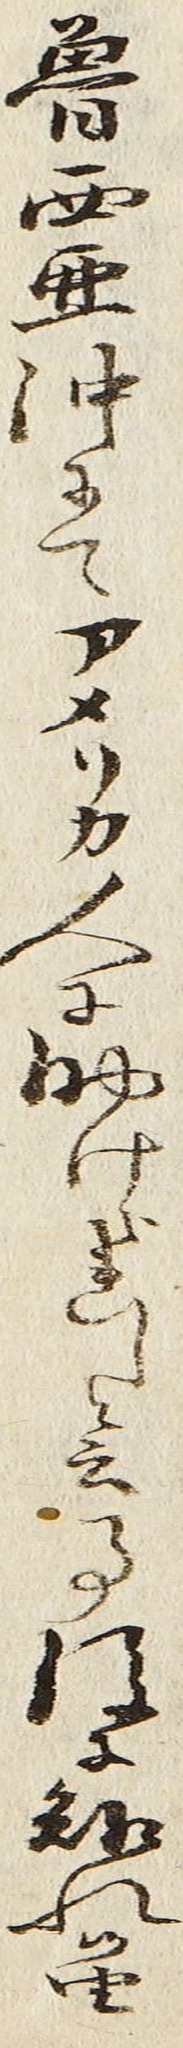魯西亜沖にてアメリカ人に助られしと云事後に知れ候由
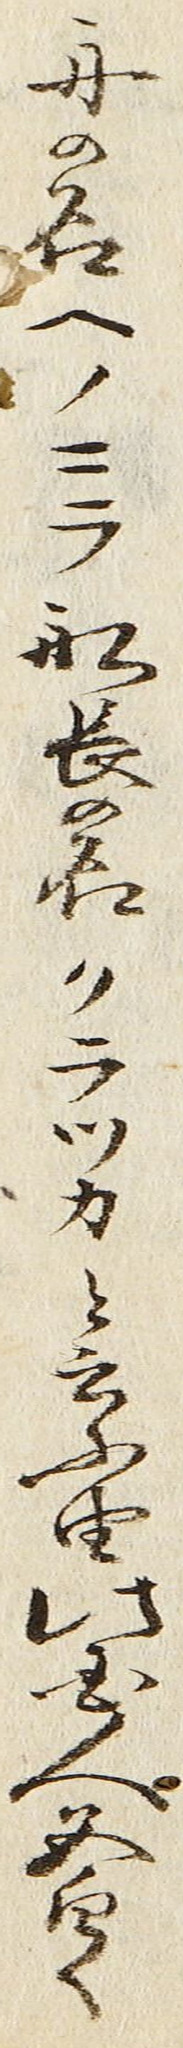舟の名ヘノニラ船長の名クラツカと云ふ由此国人色白く
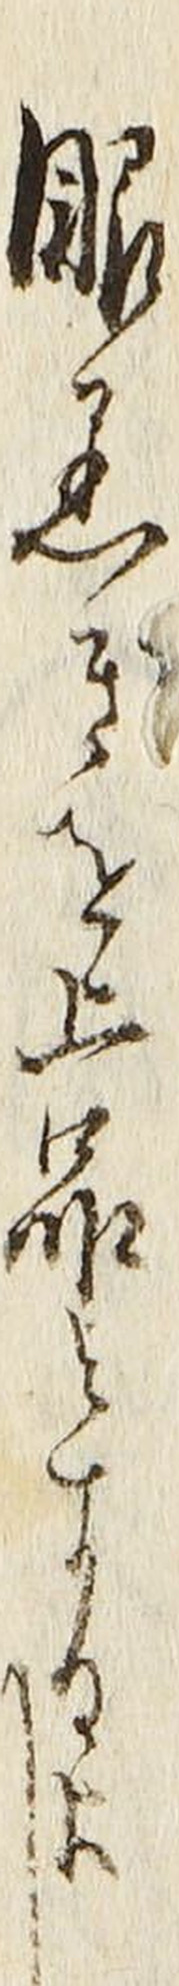眼黒きを上品とするよし
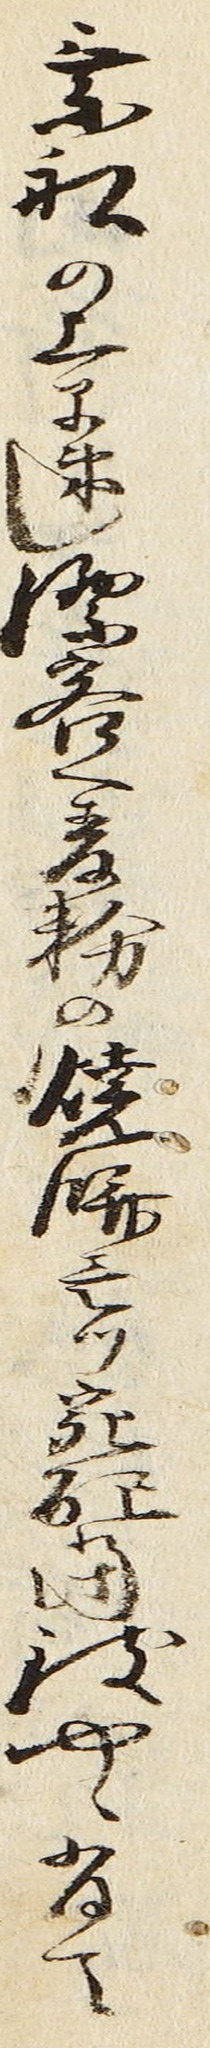乗船の上早速漂客へ麦粉の焼餅壱ツ宛配当致やゝ有て
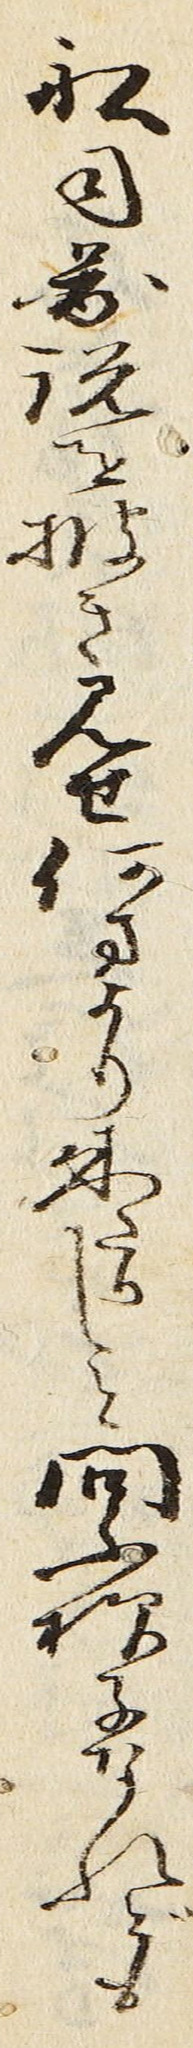船司図説を披き見せ何方より来たりしと問ふ様子なれども
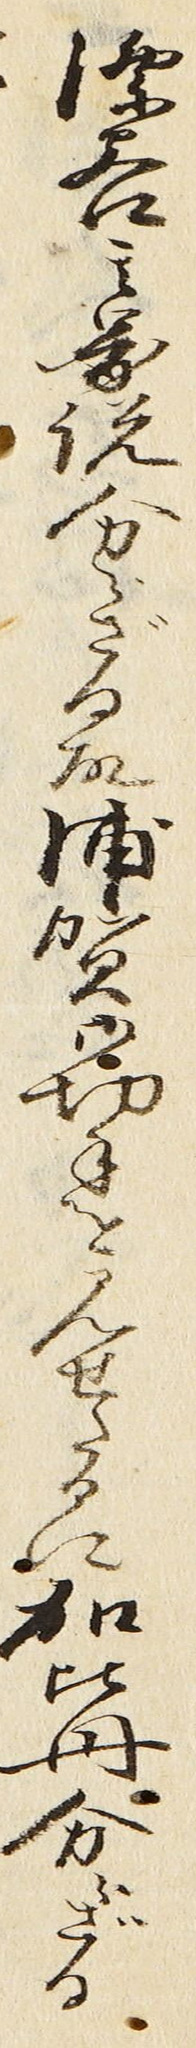漂客其図説分らざる故浦賀御切手を見せたるに加比丹分らざる
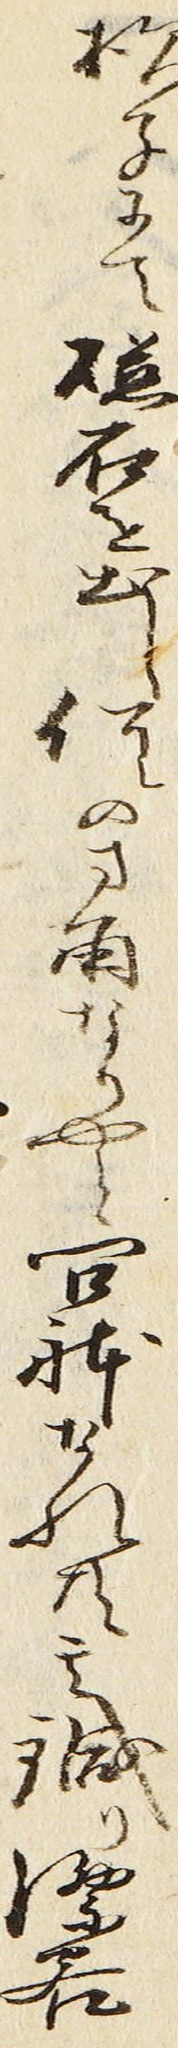様子にて磁石を出し何レの方角なりやと問体なれ共其鍼り漂客
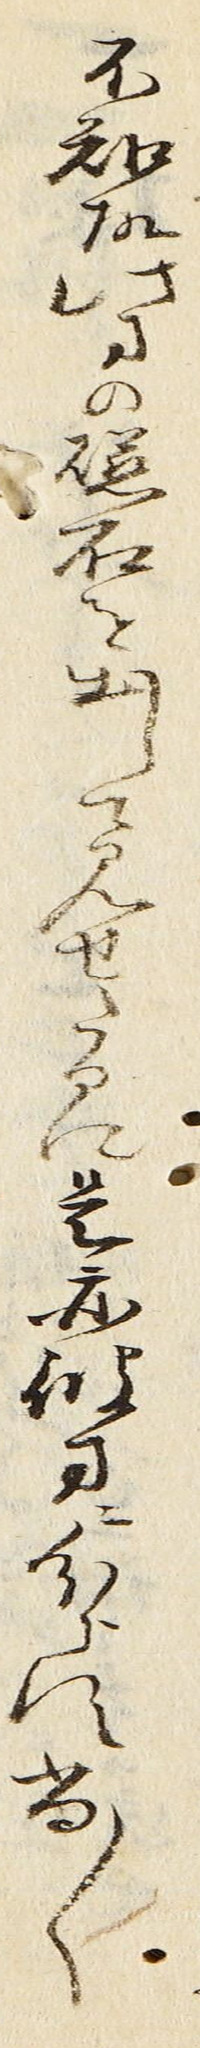不知故此方の磁石を出して見せたるに是亦彼方ニ分らす尚〳〵
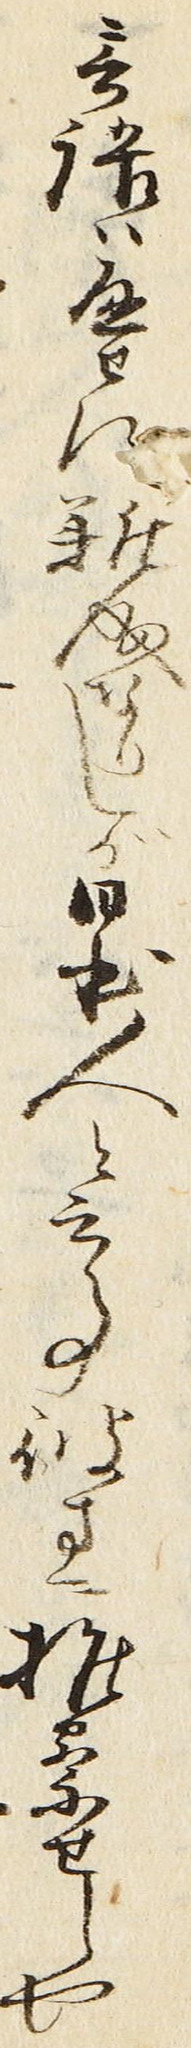言語ハ通せす難儀なりしが日本人と云事彼方ニ推察せしや
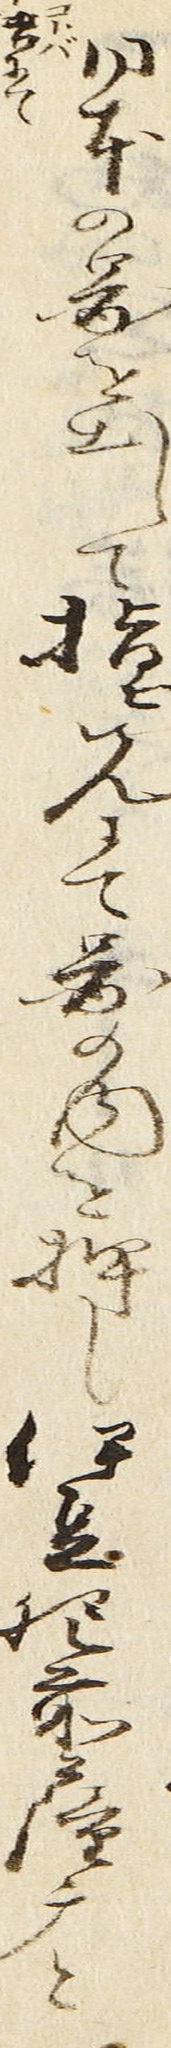日本の図を出して指ビ先にて図の内を押し伊豆肥前薩摩と
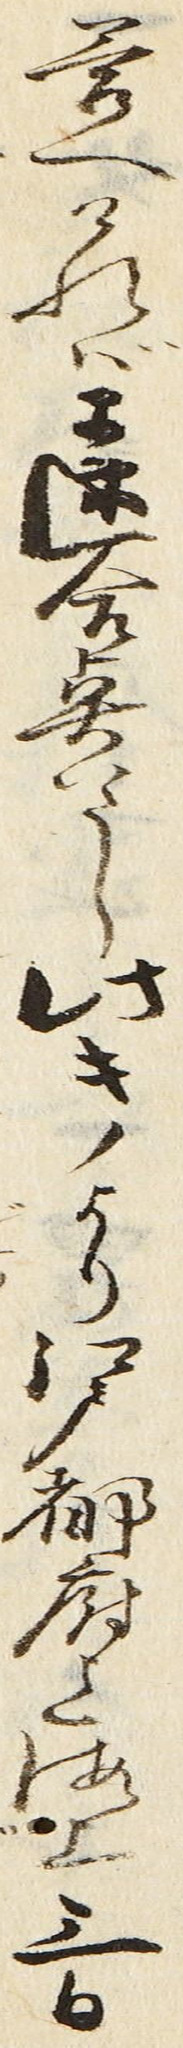答へけれバ早速合点いたし此キノより江戸都府迄海上三日
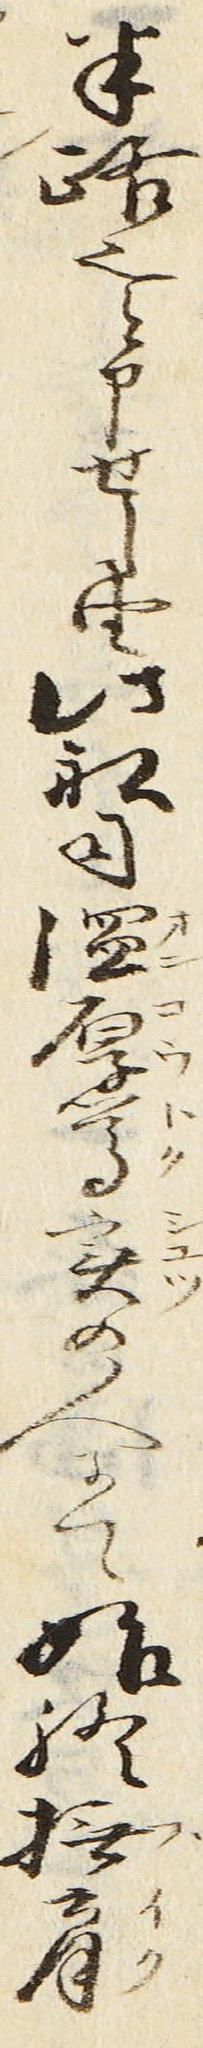半路也と申せし由此船司温厚篤実の人にて始終撫育
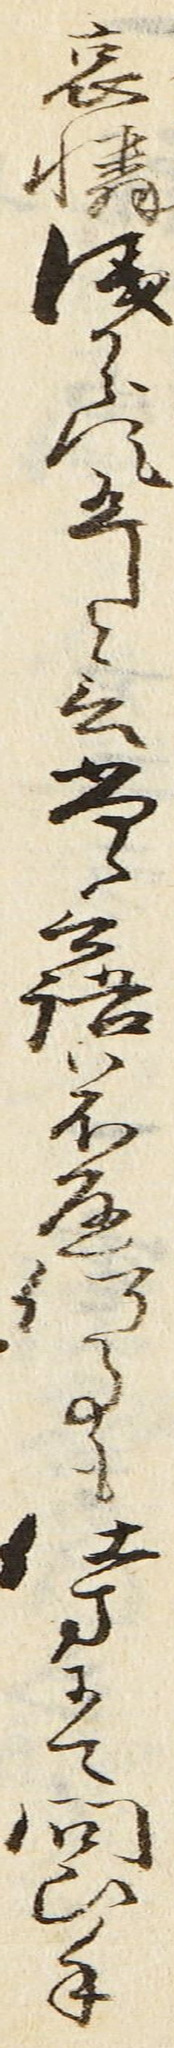哀憐浅からす有しと言尚々言語ハ不通何事も仕方にて問ひ手
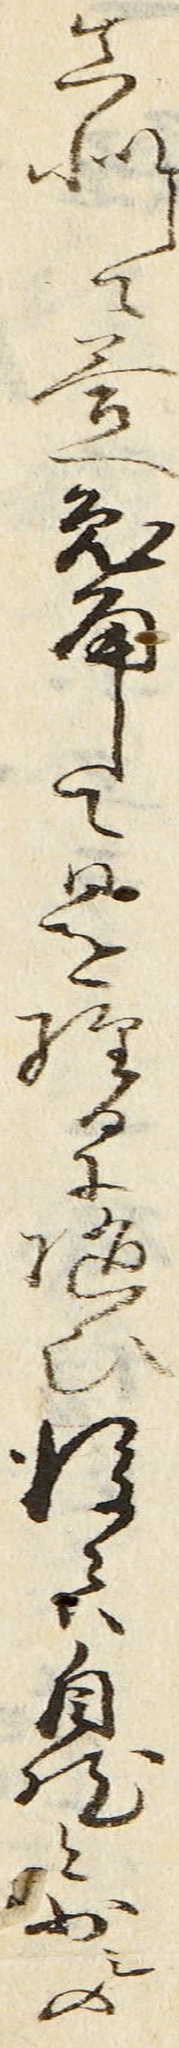真似して答へ兎角して日を経るに随ひ後ニハ自然と少シの
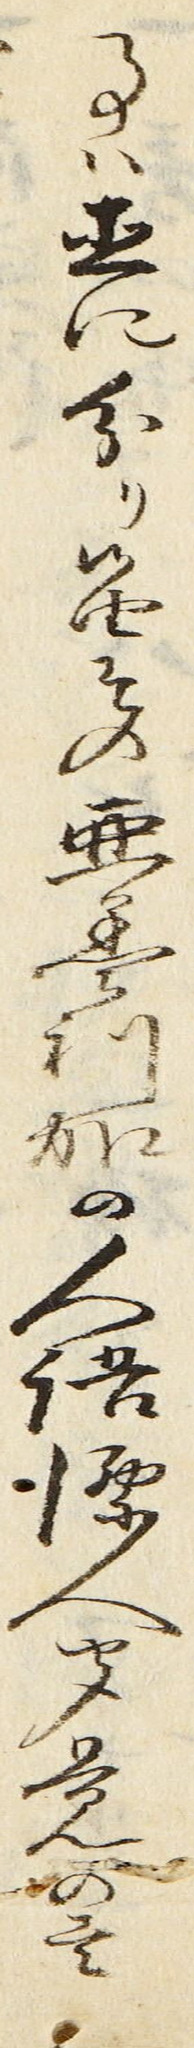事ハ直に分り候由その亜墨利加の人語漂人聞覚の壱
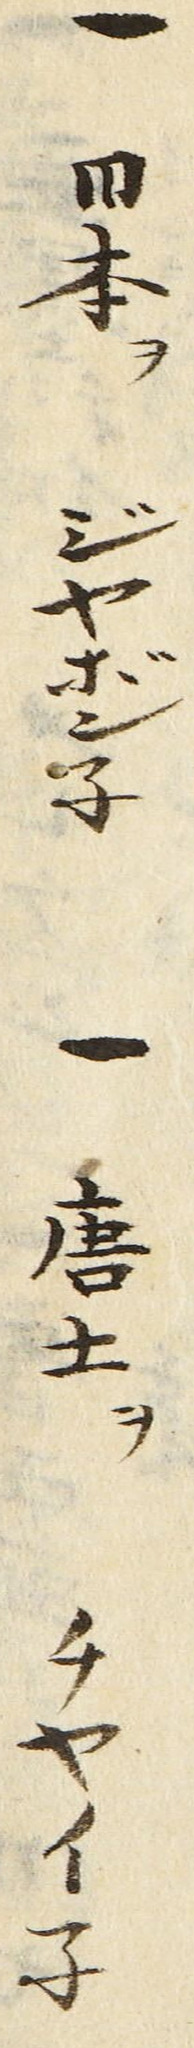一日本ヲジヤボンネ一唐土ヲチヤイネ
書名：亜墨利加漂流記聞
